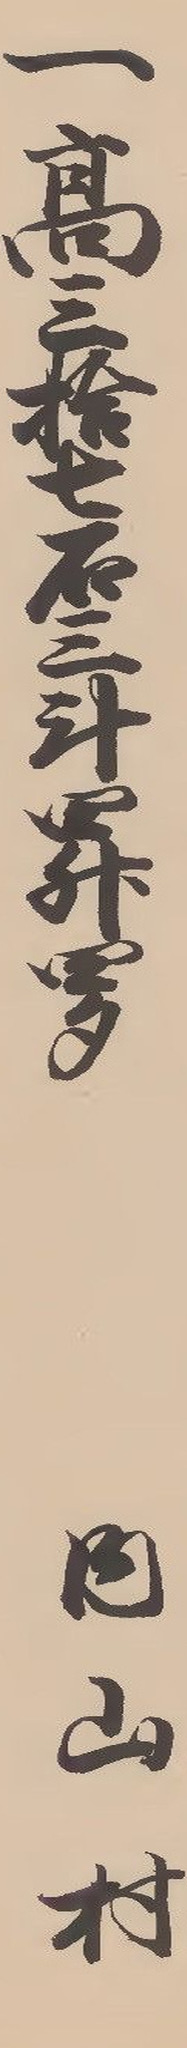一高三拾七石三斗四升四勺内山村
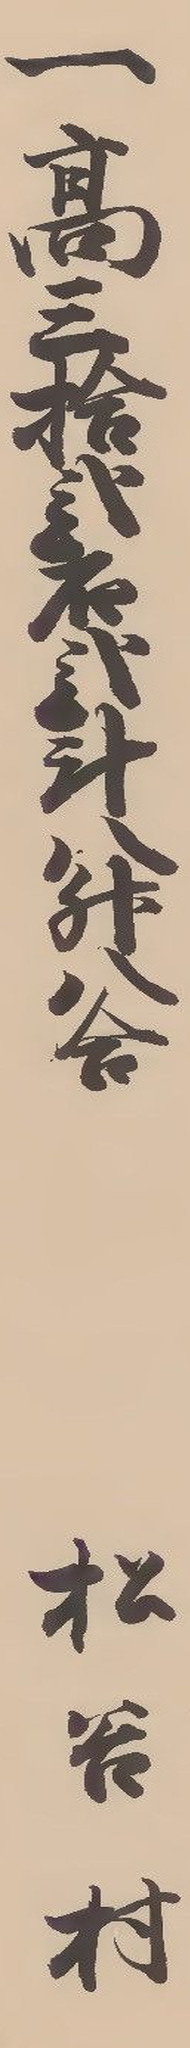一高三拾弐石弐斗八升八合松谷村

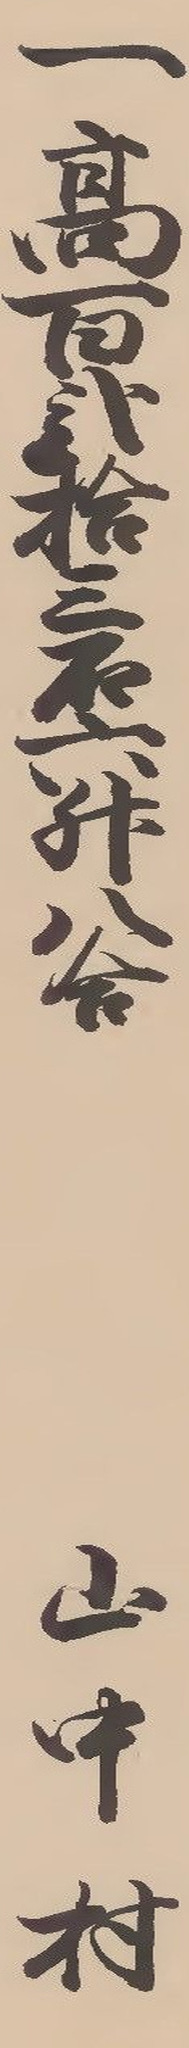一高百弐拾三石六升八合山中村
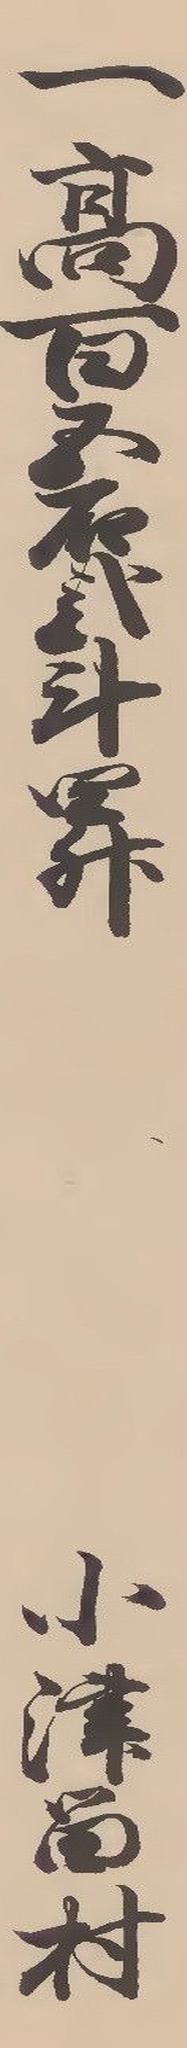一高百五石弐斗四升小津留村
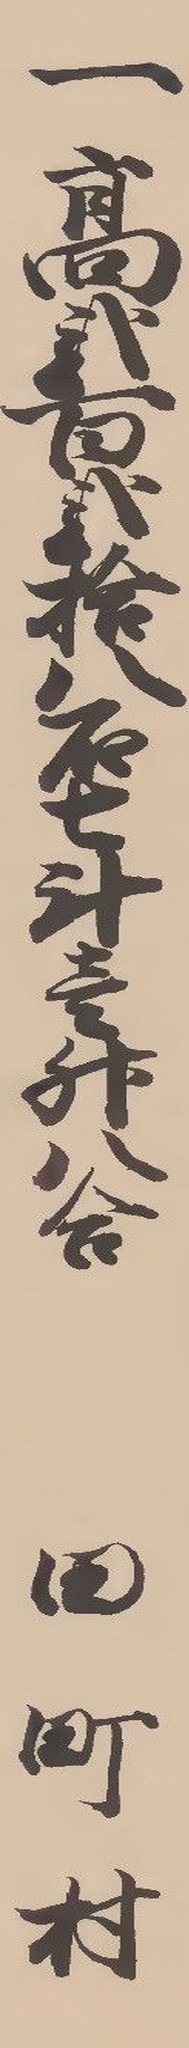一高弐百弐拾八石七斗壱升八合田町村
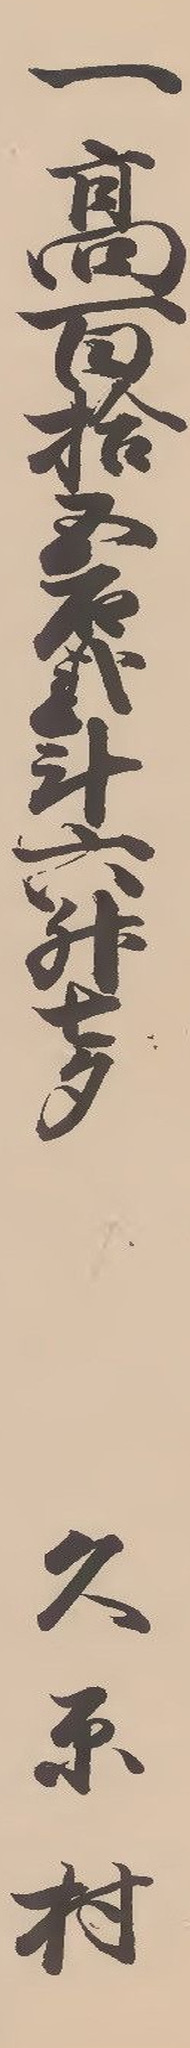一高百拾五石弐斗六升七勺久原村
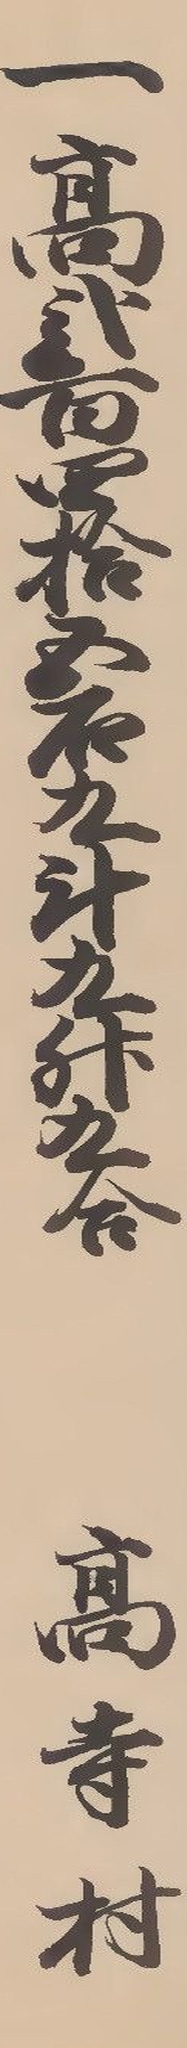一高弐百四拾五石九斗九升九合高寺村
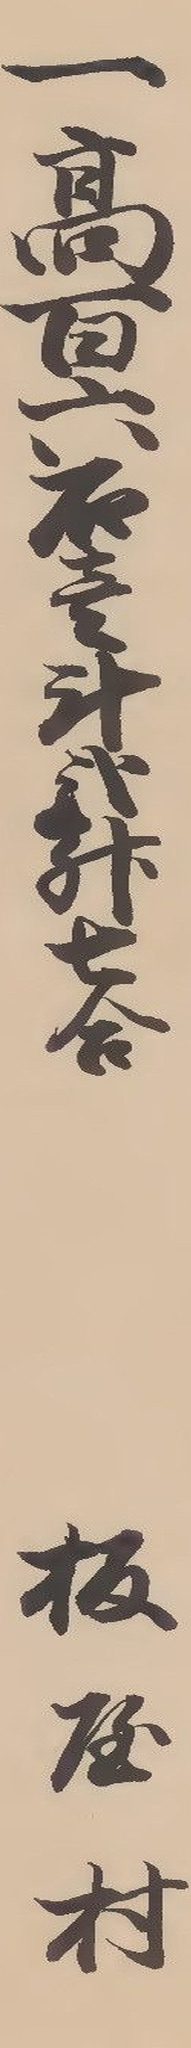一高百六石壱斗弐升七合板屋村
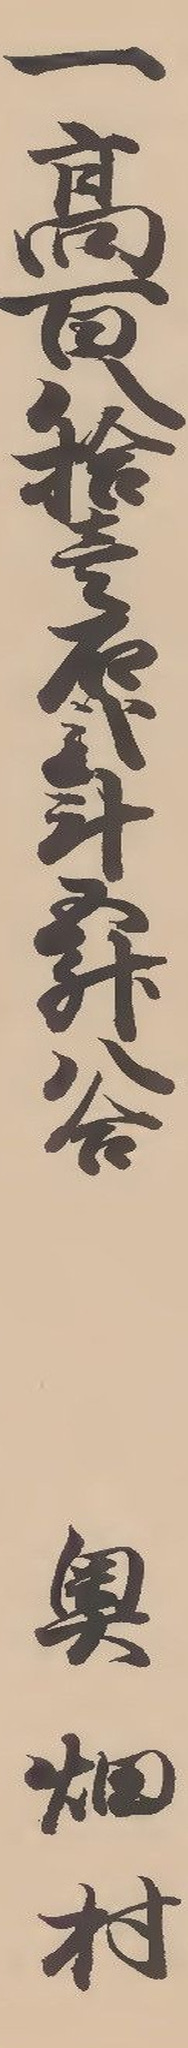一高百八拾壱石弐斗五升八合奥畑村
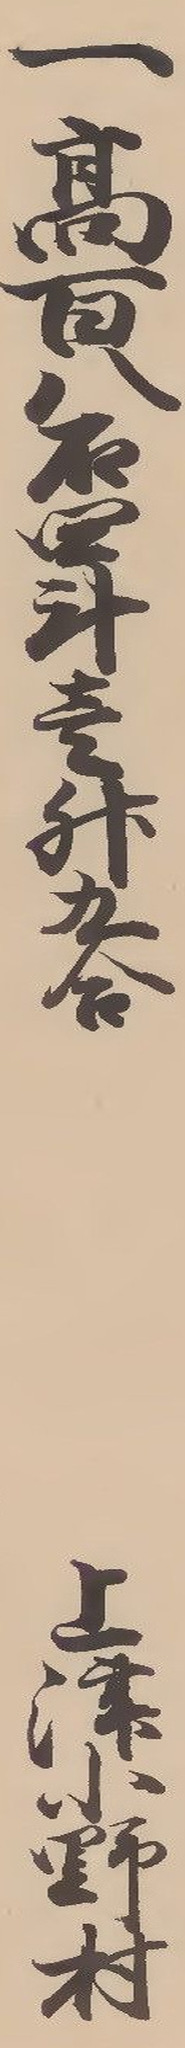一高百八石四斗壱升九合上津小野村

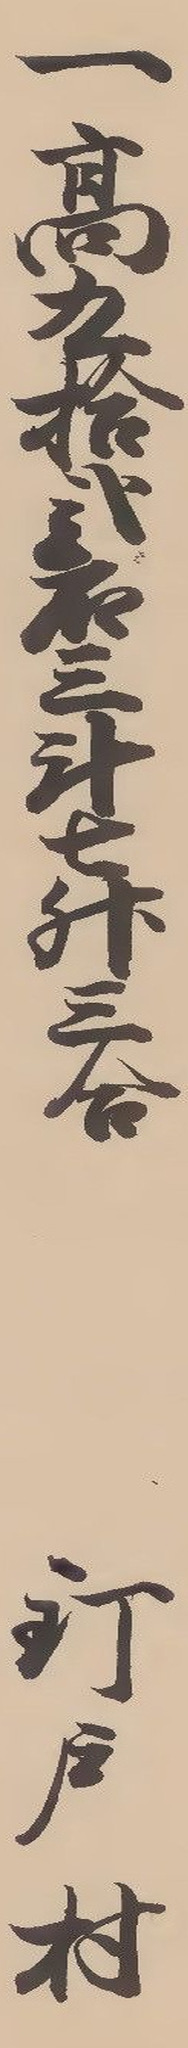一高九拾弐石三斗七升三合釘戸村
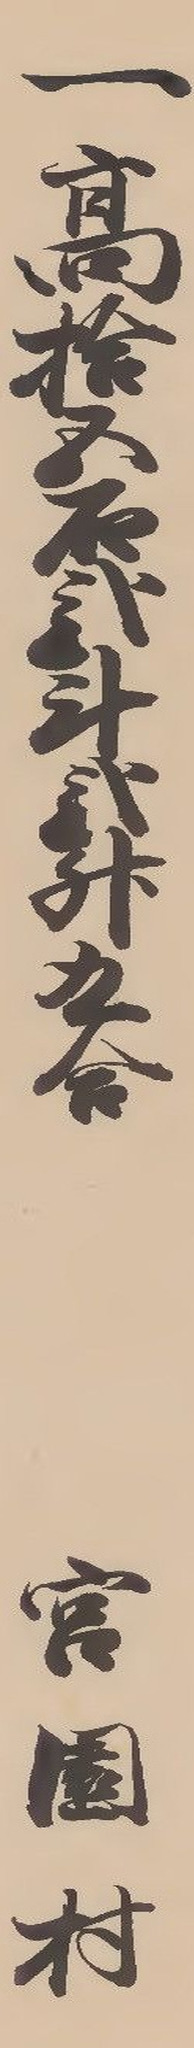一高拾五石弐斗弐升九合宮園村
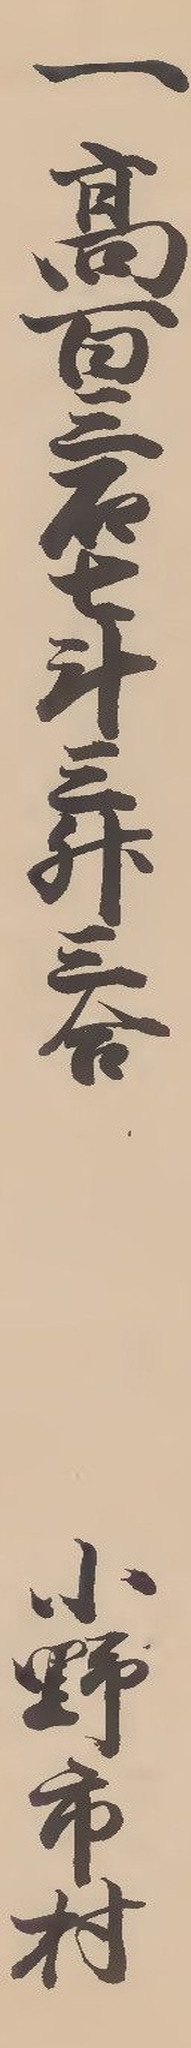一高百三石七斗三升三合小野市村
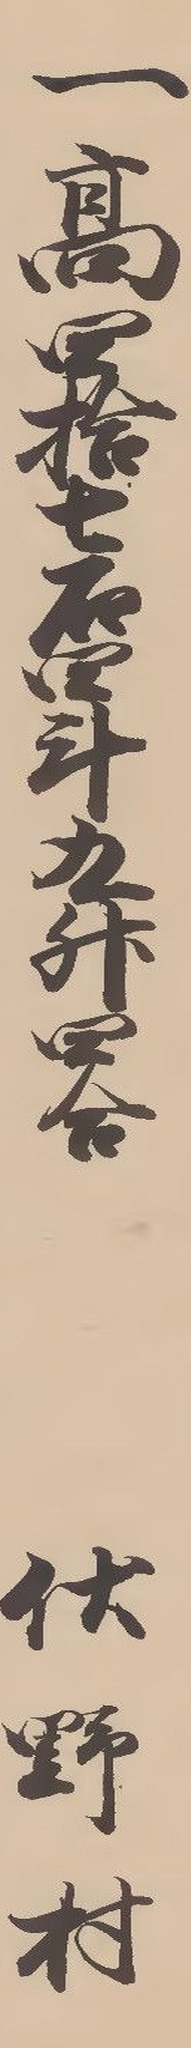一高四拾七石四斗九升四合伏野村
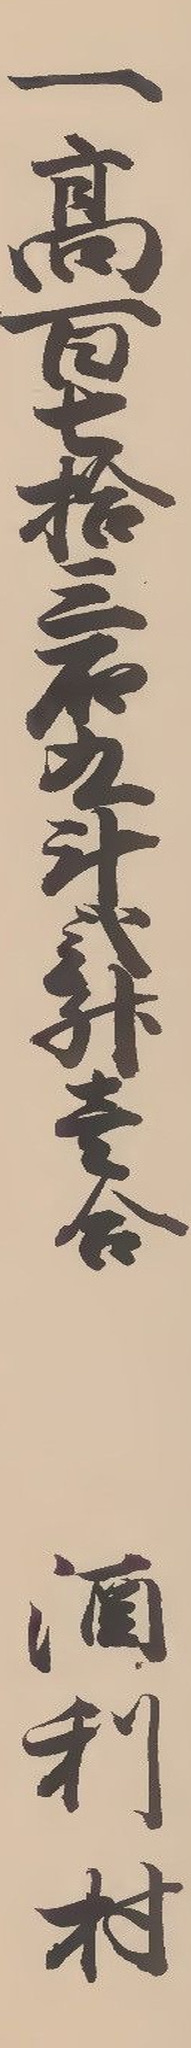一高百七拾三石九斗弐升壱合酒利村
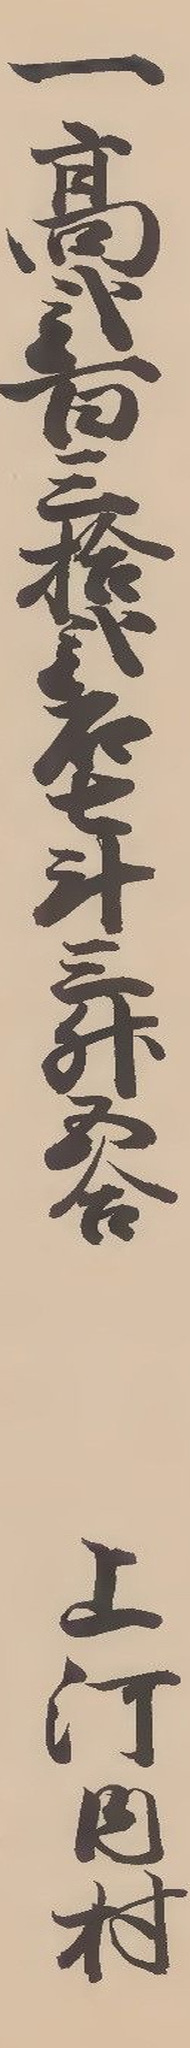一高弐百三拾弐石七斗三升五合上河内村
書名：豊後国郷帳
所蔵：国立公文書館 National Archives of Japan
